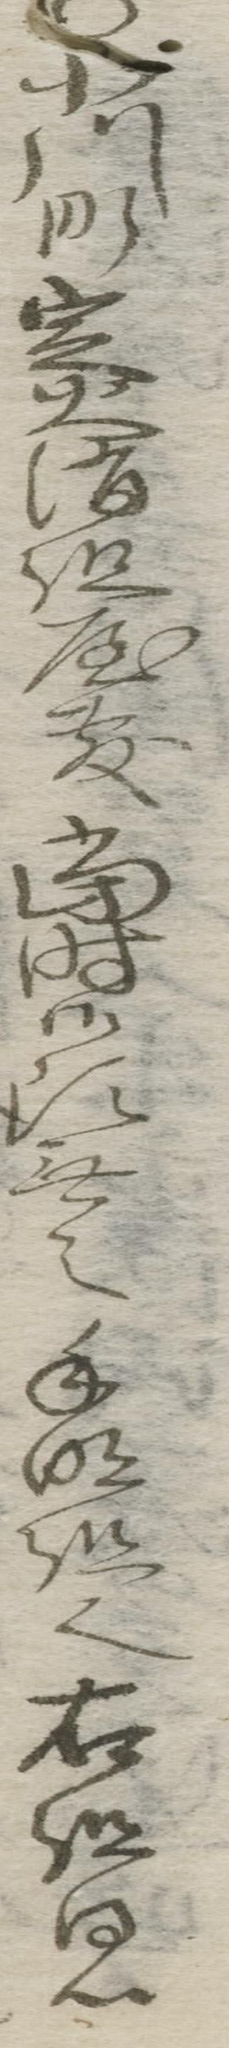○小川町定火消組屋敷当時御頭無之手明組也右組同心
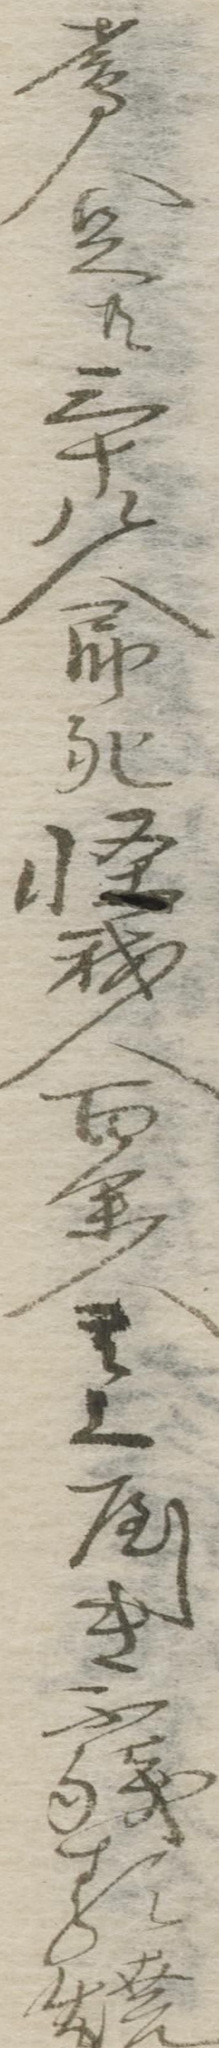鳶人足共三十八人即死怪我人百余人其上屋しき不残類焼

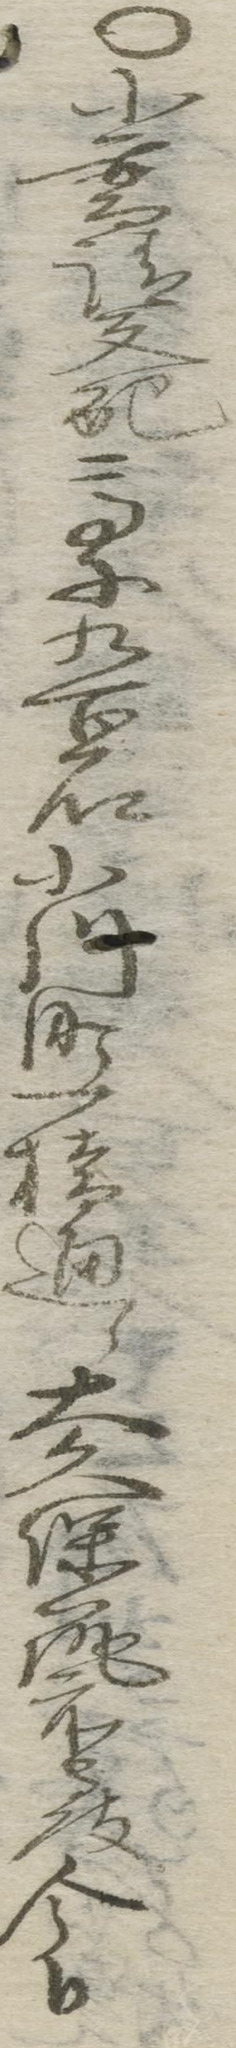○小普請支配高千九百石小川町一橋通り大久保筑前守殿今日
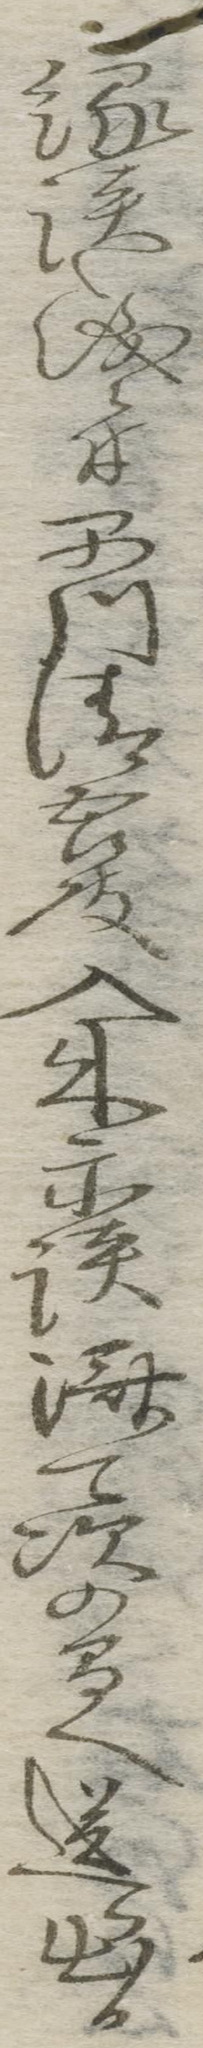縁談之儀ニ付品川清五郎殿入来示談済て次の間へ送り出る
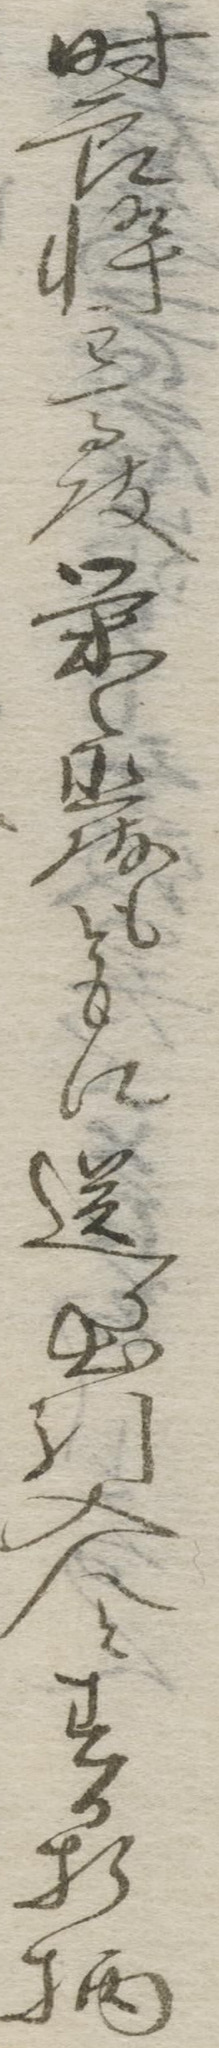時節悴主馬殿栄之丞殿もともに送り出引入んとする折柄
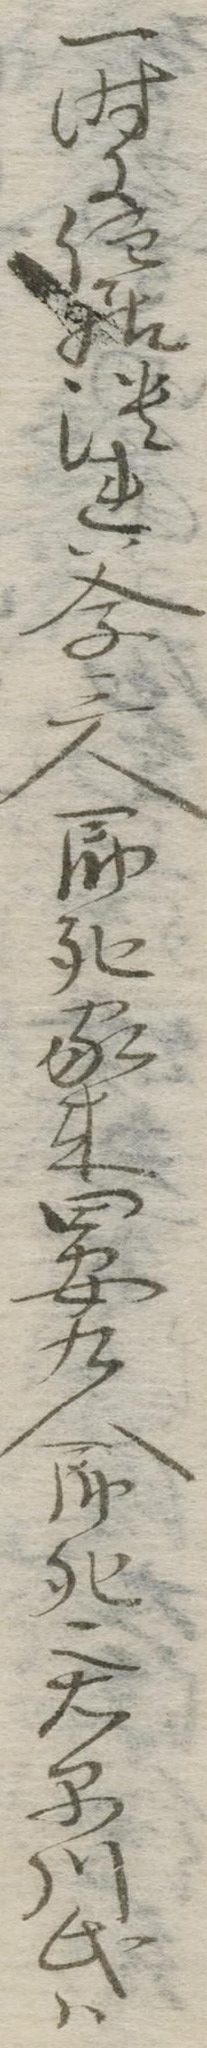一時に住居潰れ父子三人即死家来男女九人即死也右品川氏ハ
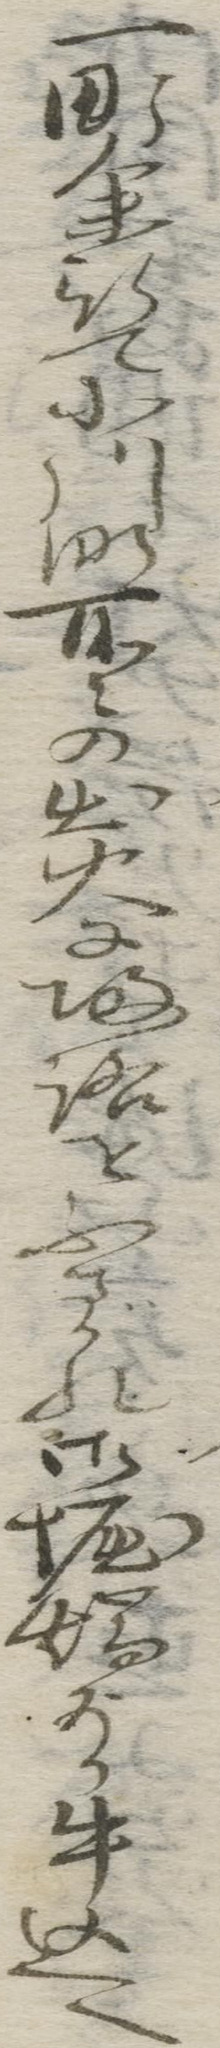一町余行て小川町所々の出火に帰路をふさかれ御堀端より牛込へ
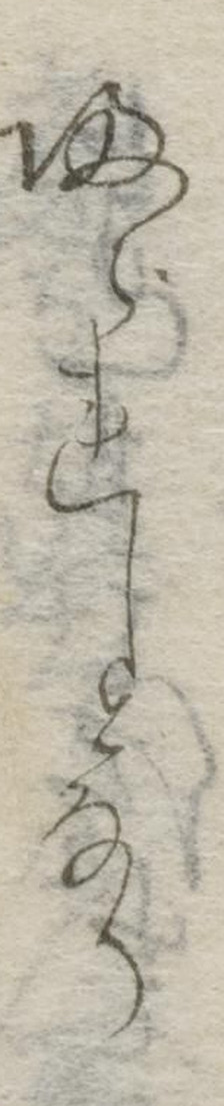帰られしとなり
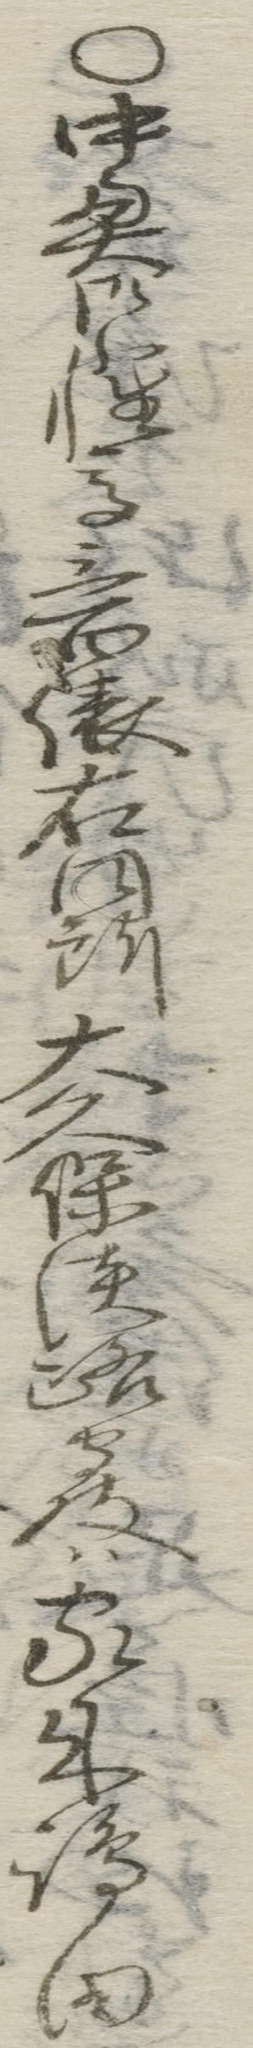○中奥御小性高三百表右同所大久保淡路守殿御家来嶋田
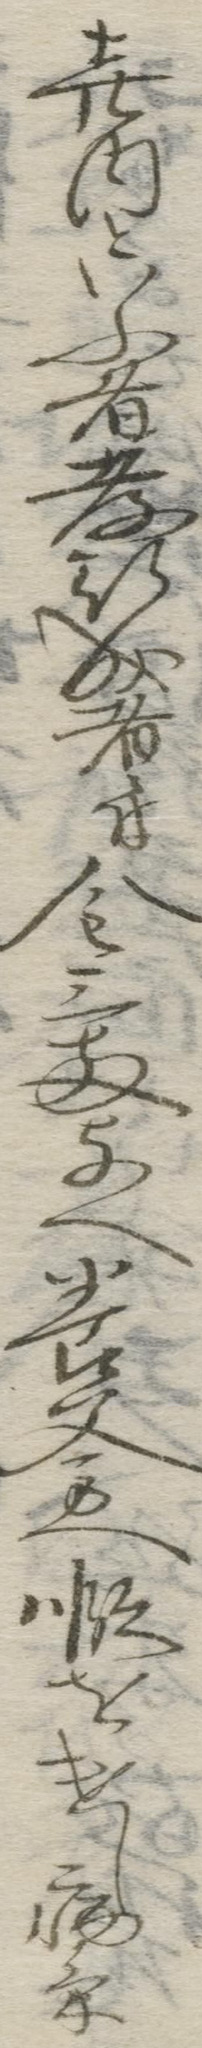喜内といふ者孝行成者ニ付金三両与へ養父方へ暇を遣し病気
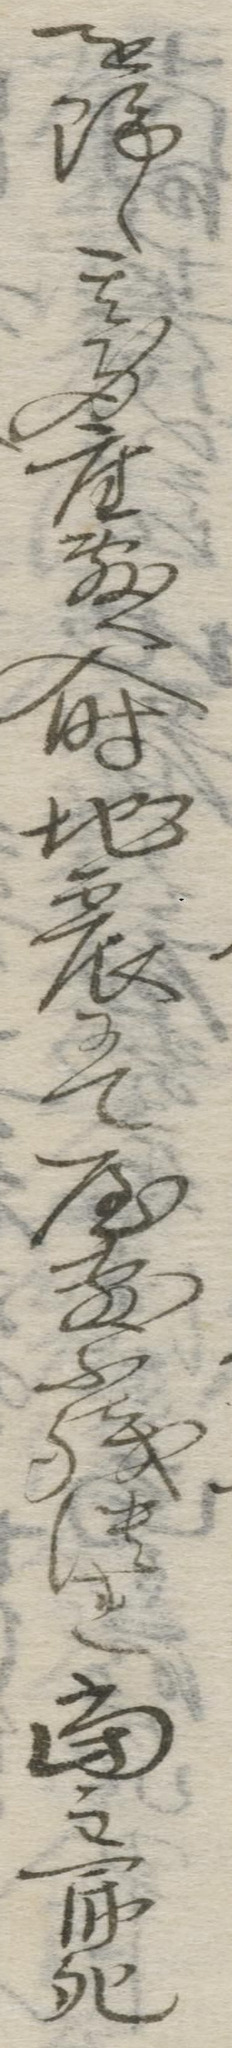を隠し其身座敷へ入時地震にて屋敷不残潰れ当主即死
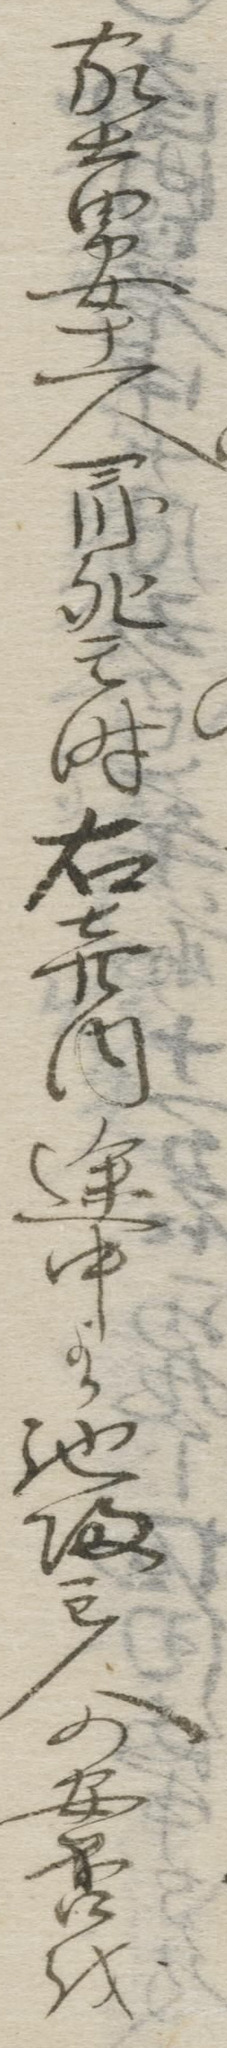家士男女十一人即死其時右喜内途中より馳帰主人の安否を
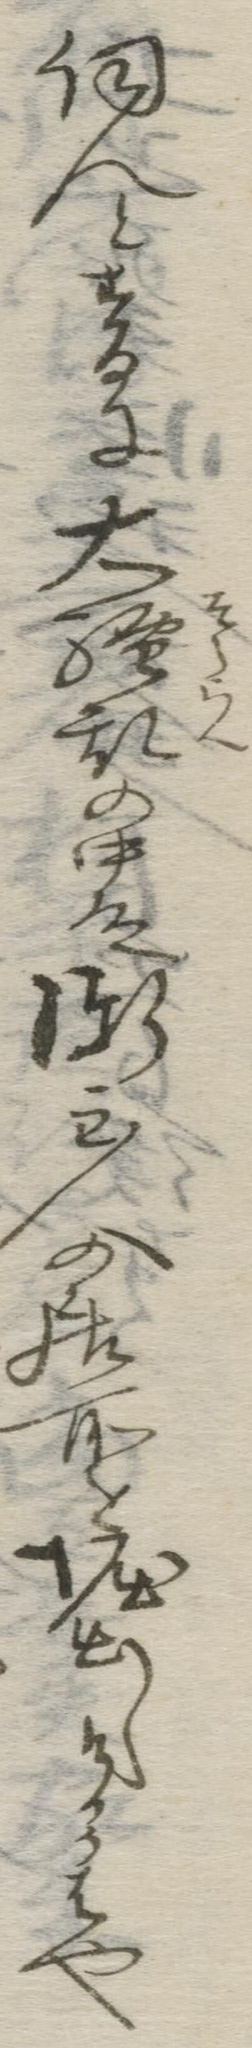伺んとするに大騒乱の中故漸主人の居所を掘出しけるかはや
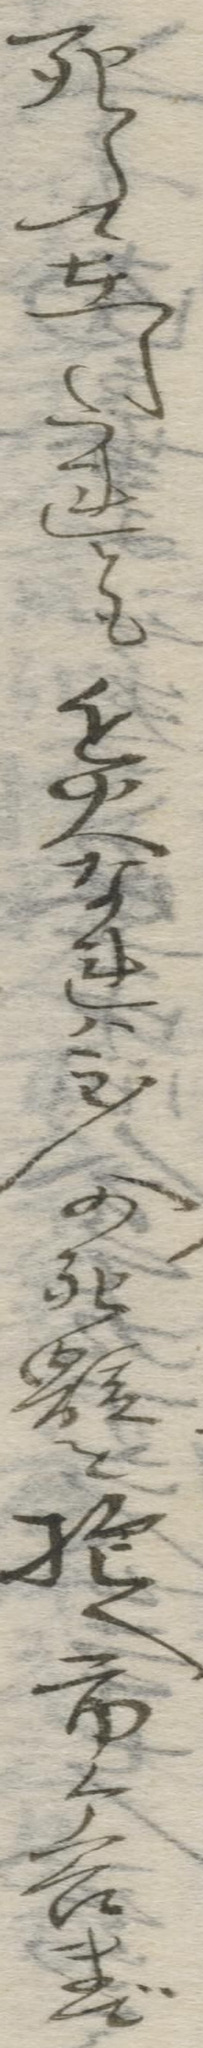死して在たれとも近火なれハ主人の死骸を抱へ市ヶ谷まで
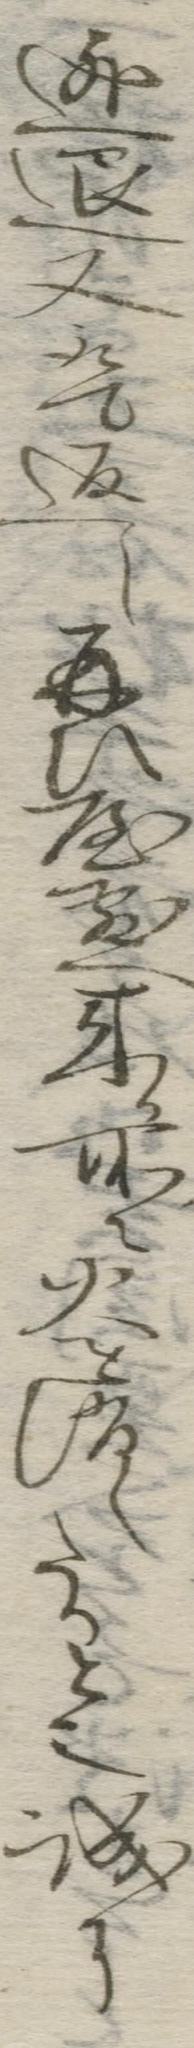逃退又取て返し再ひ屋敷へ来り所々火を消したりと也誠に
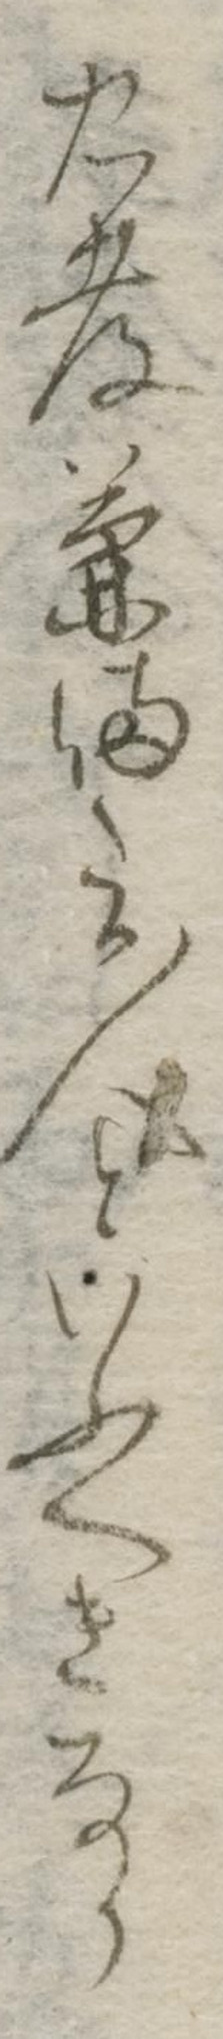忠孝兼備たる人といふへきなり
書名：江戸中諸屋敷　地震竒談録
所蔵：東京大学地震研究所図書室 Earthquake Research Institute Library, The University of Tokyo, JAPAN
